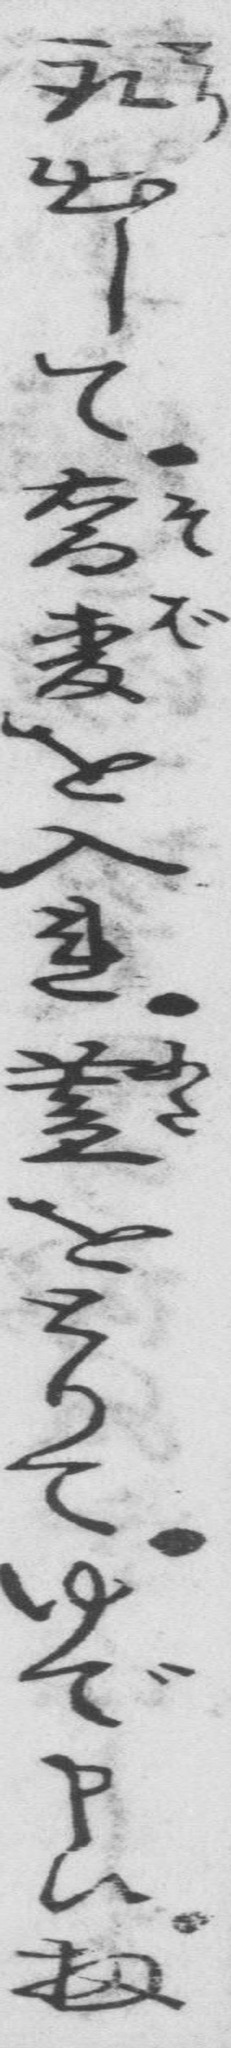取出して。蕎麦を入れ。蓋をとりて。ゆで申候。扨
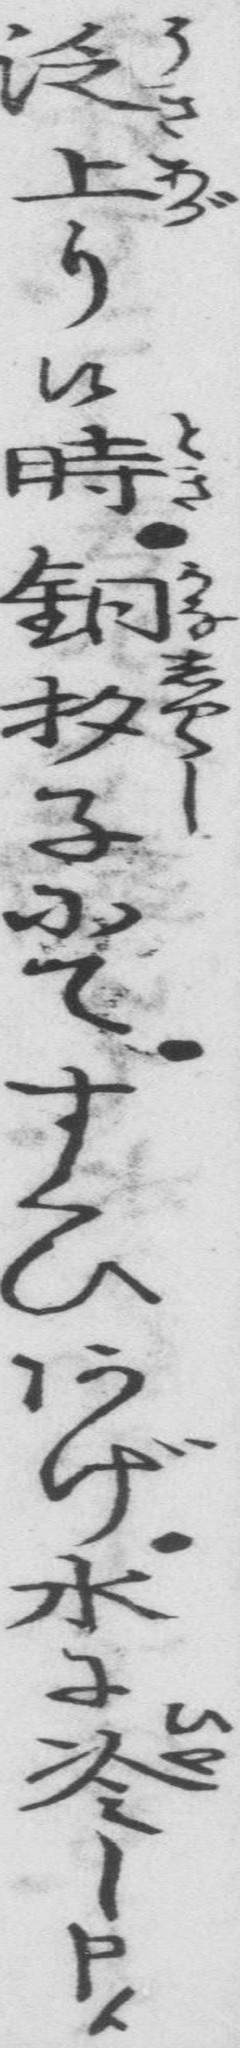泛上り候時。銅杓子にて。すくひあげ。水に冷し申候
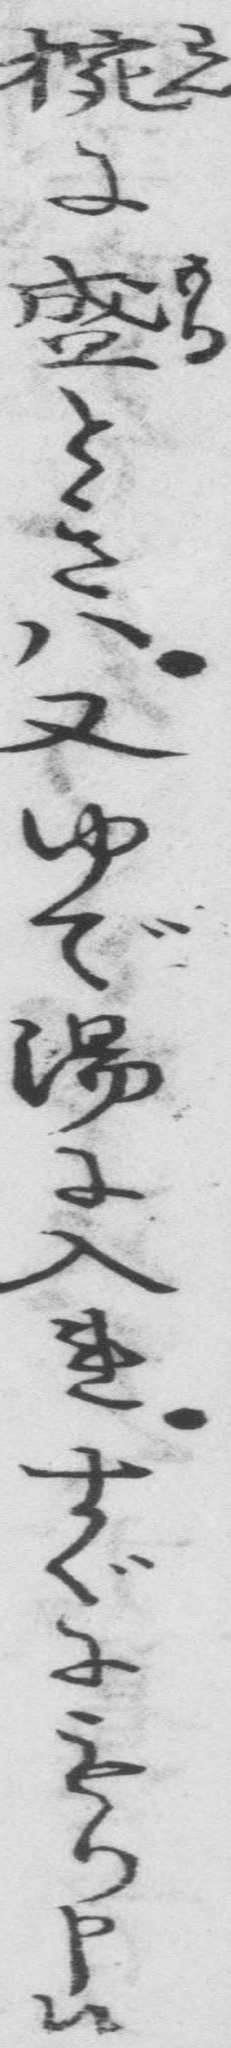椀に盛ときは。又ゆで湯に入れ。すぐにもり申候
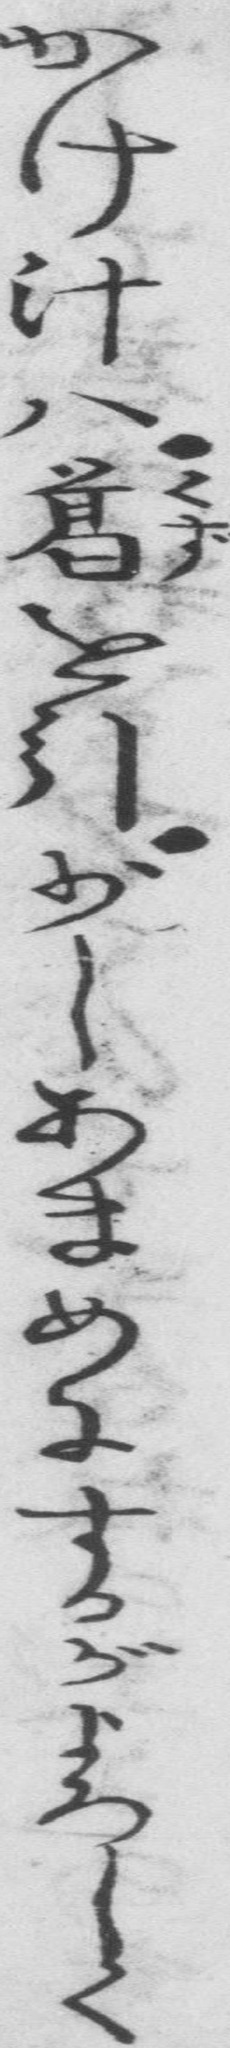かけ汁は。葛を引。少しあまめにするがよろしく
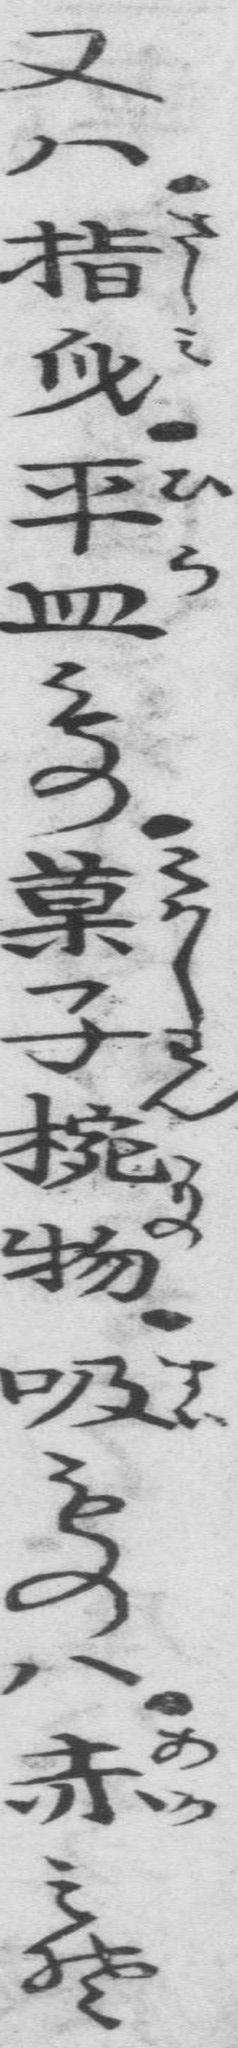又は。指身。平皿もの。菓子椀物。吸ものは。赤みそ
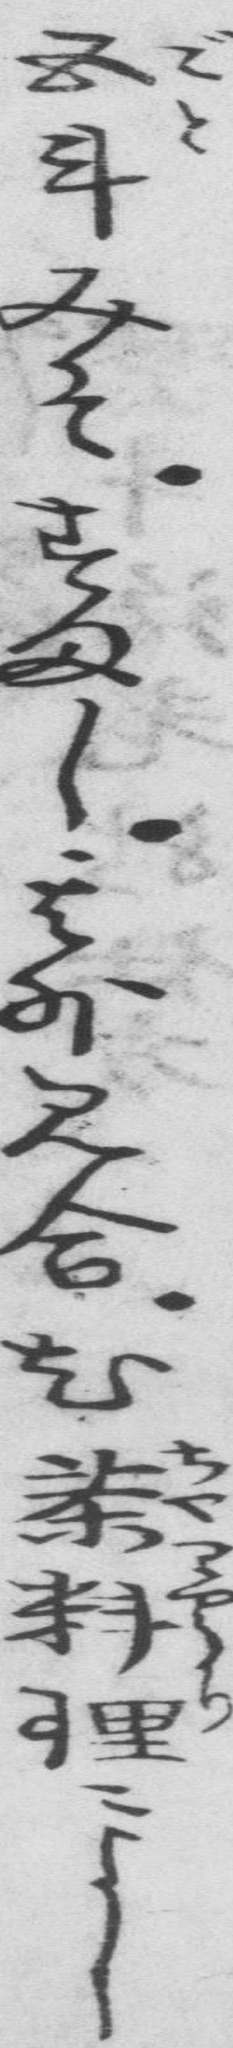五斗みそ。すまし。其外見合。尤茶料理によし

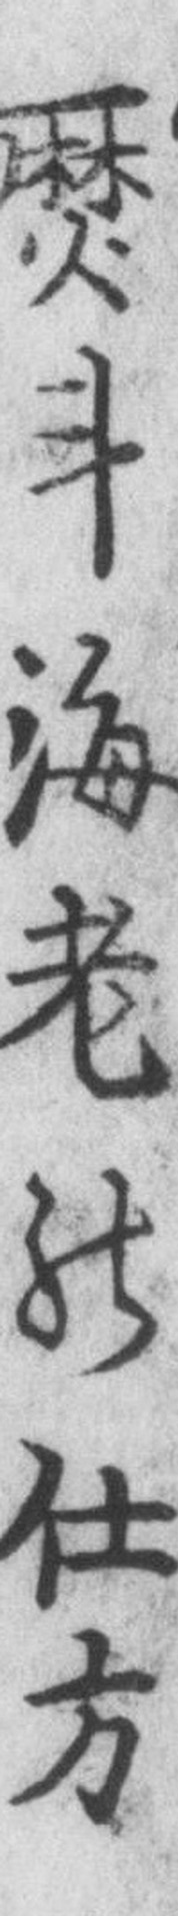熨斗海老の仕方
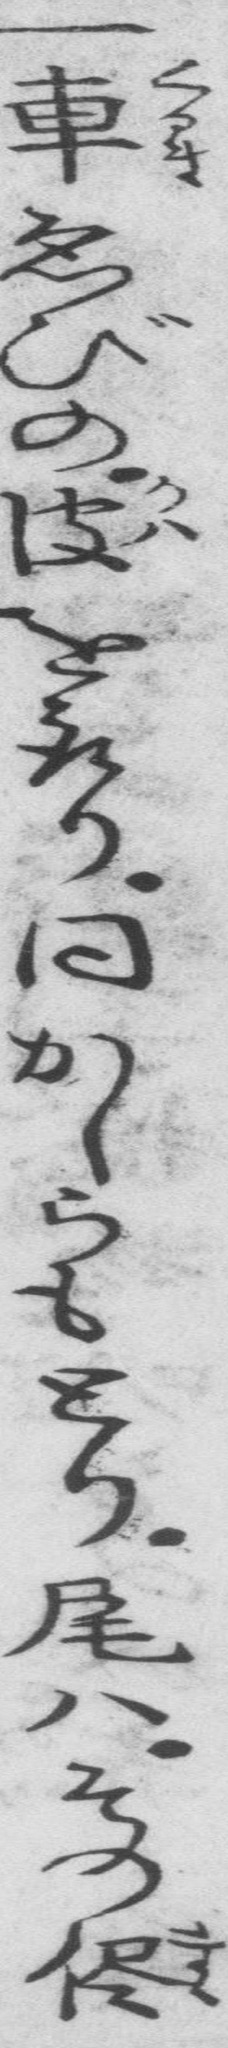一車ゑびの。皮を取り。同かしらもとり。尾は。その侭
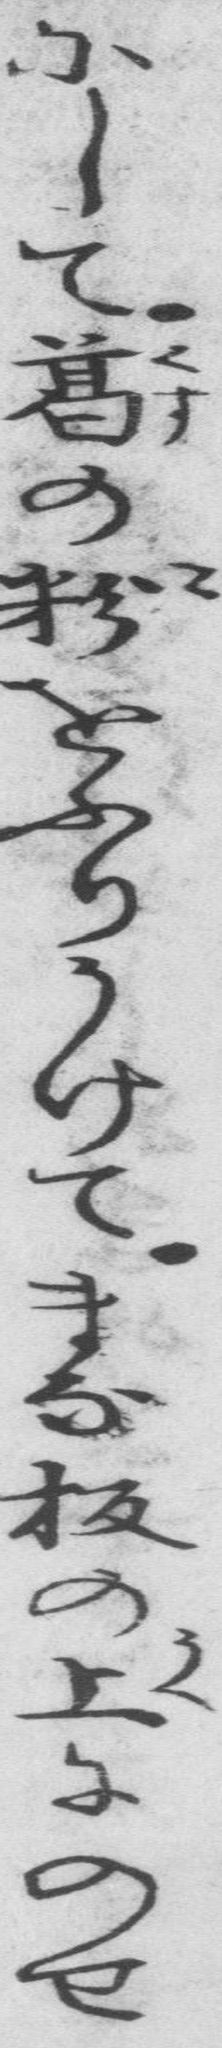にして。葛の粉をふりかけて。まな板の上にのせ
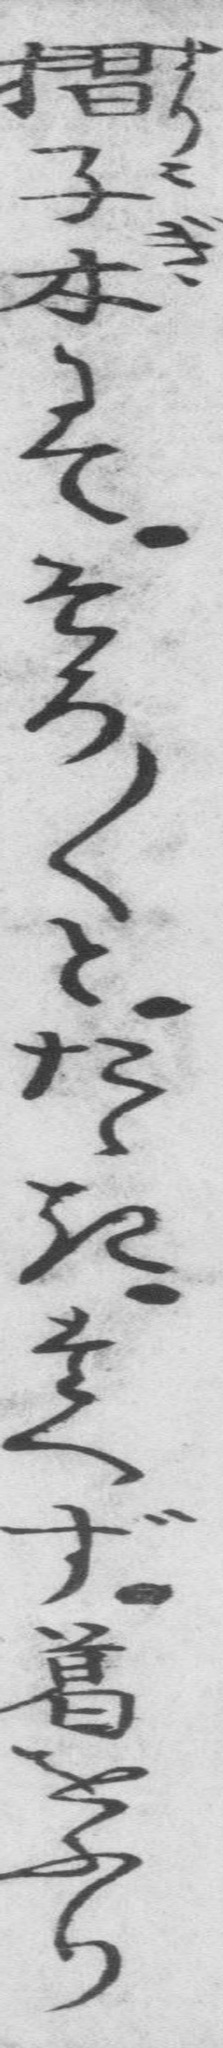摺古木にて。そろ〳〵と。たゝき。たへず。葛をふり
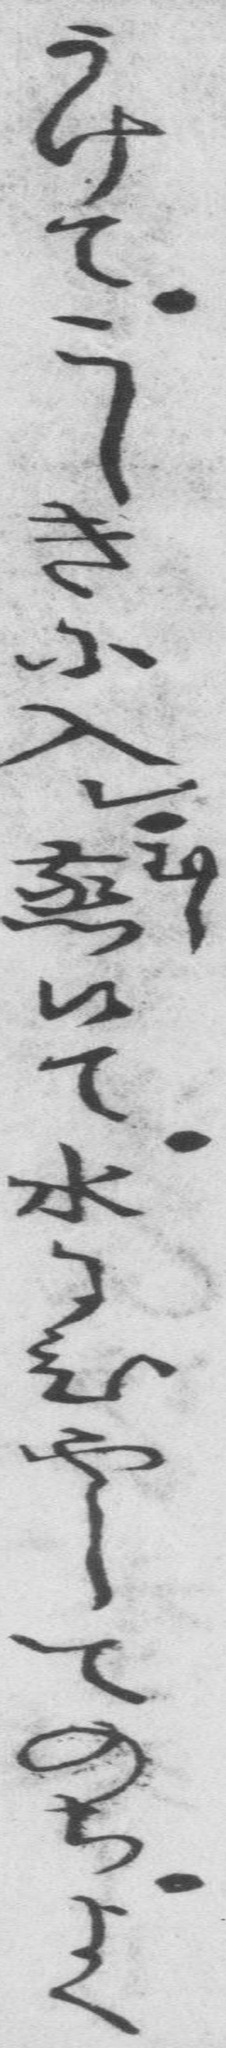かけて。こしきに入れ。蒸候て。水にひやしてのち。よく
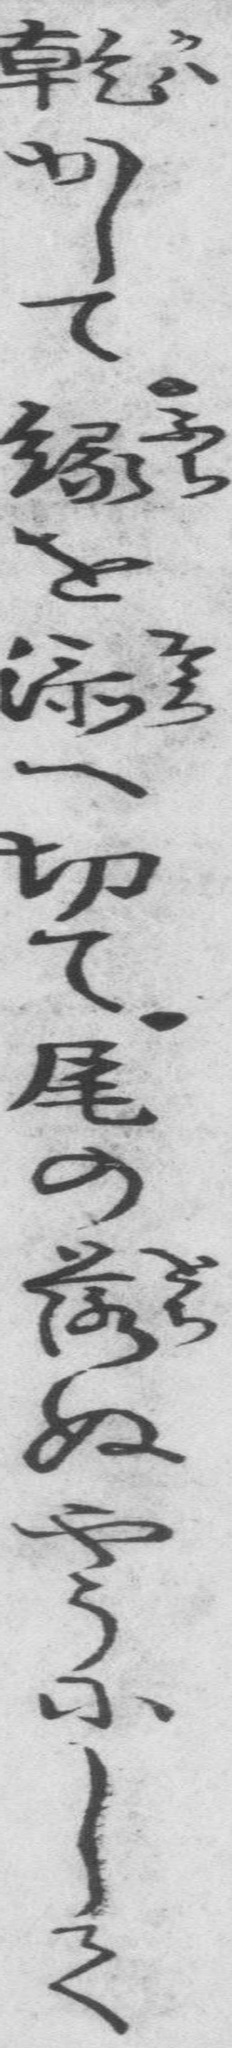乾かして。縁を添へ切て。尾の落ぬやうにして
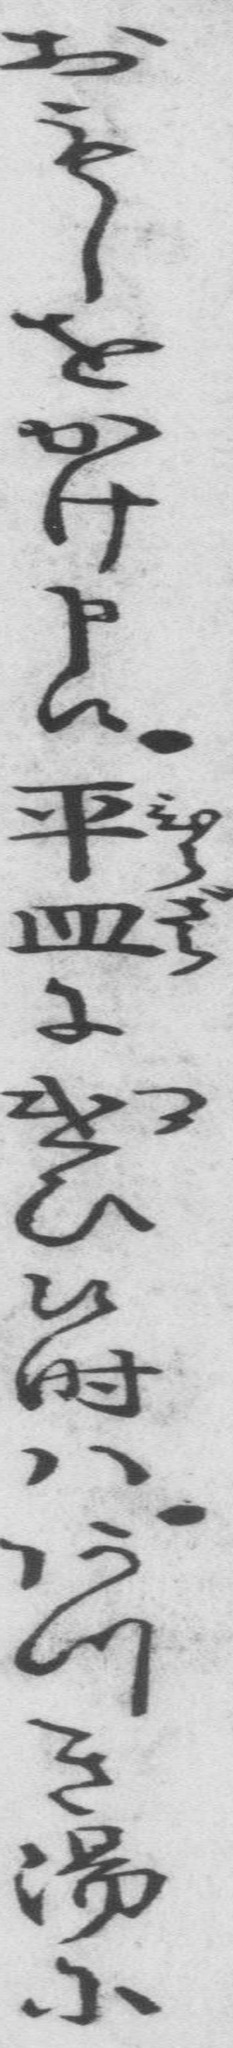おもしをかけ申候。平皿に遣ひ候時は。あつき湯に
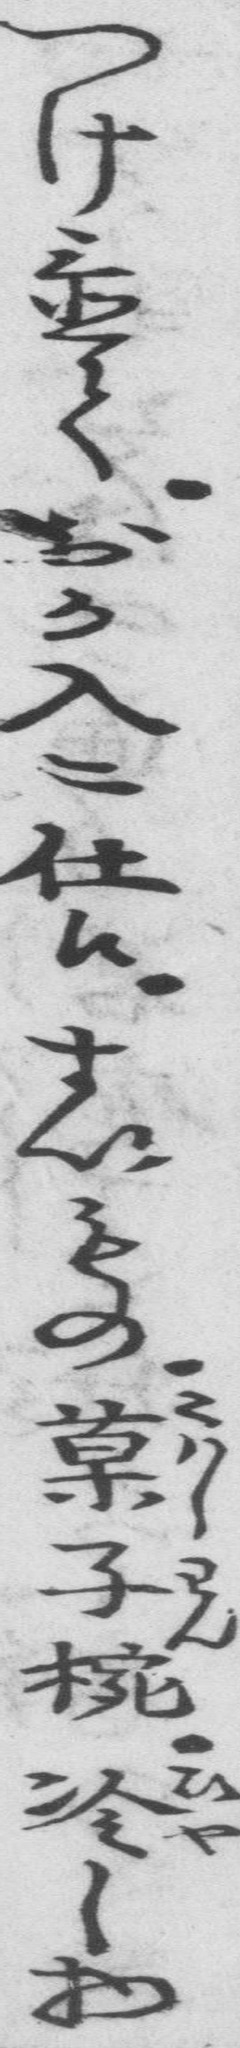つけ置て。おか入に仕候。すいもの。菓子椀。冷し物
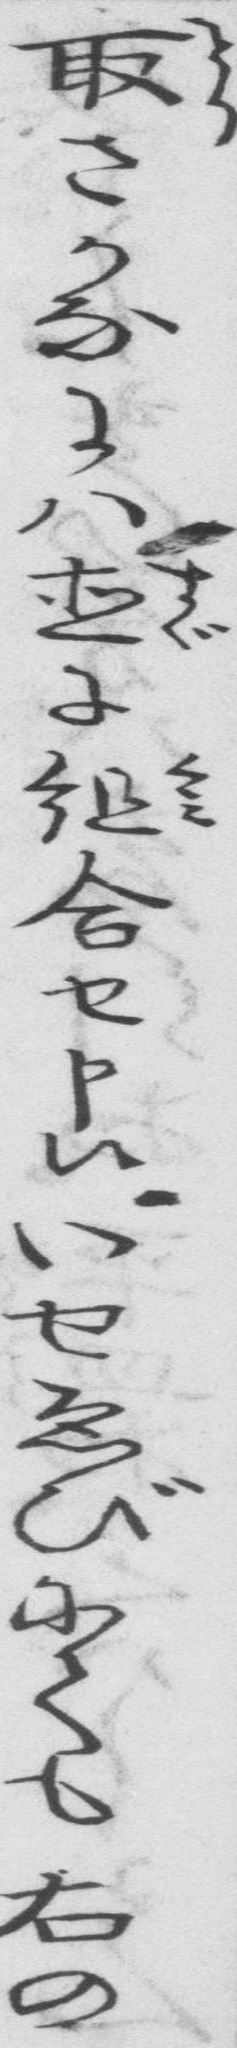取さかなには直に組合せ申候。いせゑびにても右の
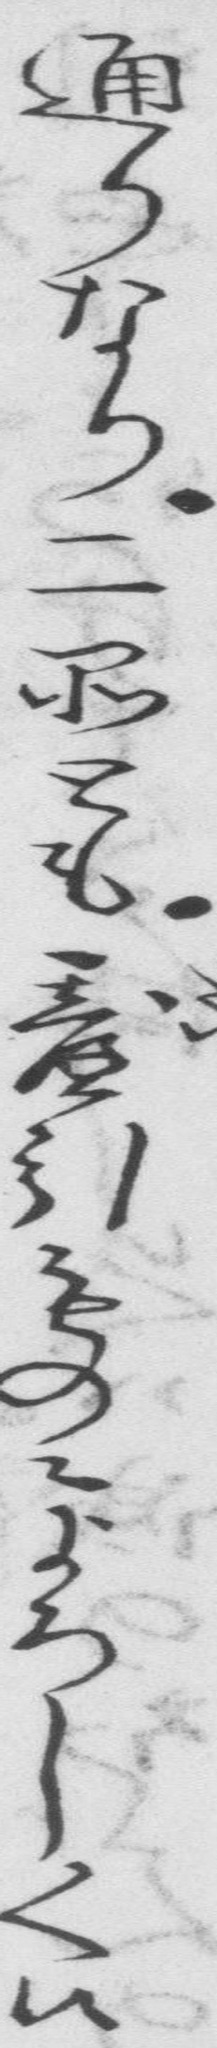通りなり。二品とも。台引ものによろしく候
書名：萬寳料理秘密箱
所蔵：大阪府立大学学術情報センター 国文学研究資料館
